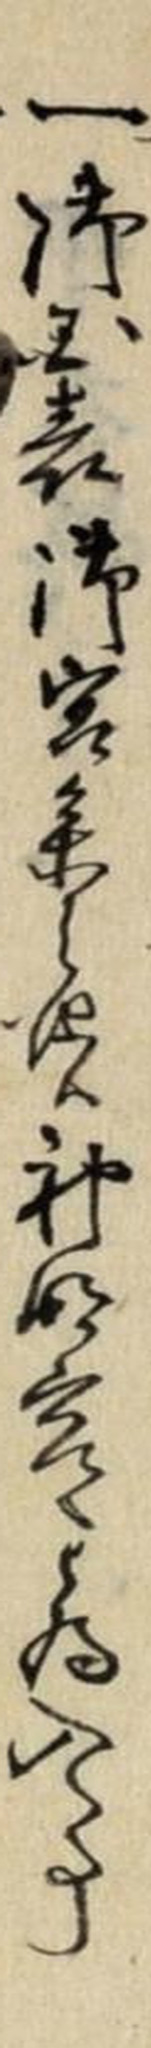一御国表御宮参之儀は神明宮へ被為入候事
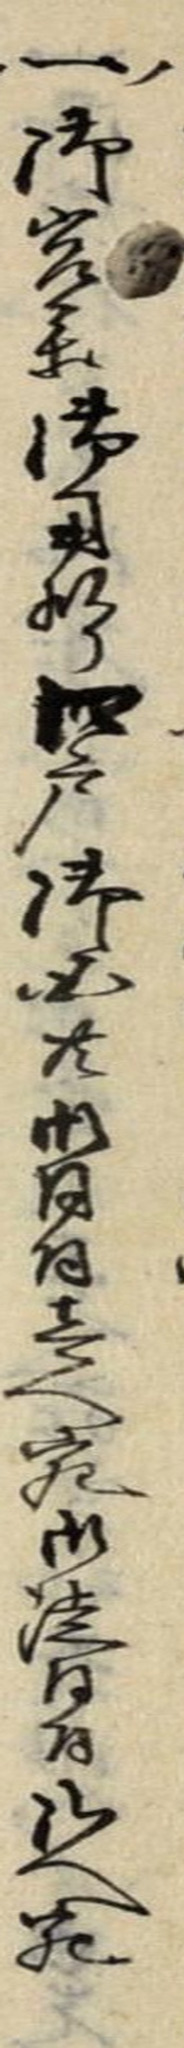一御宮参御用掛り江戸御国共御目付壱人御徒目付弐人宛
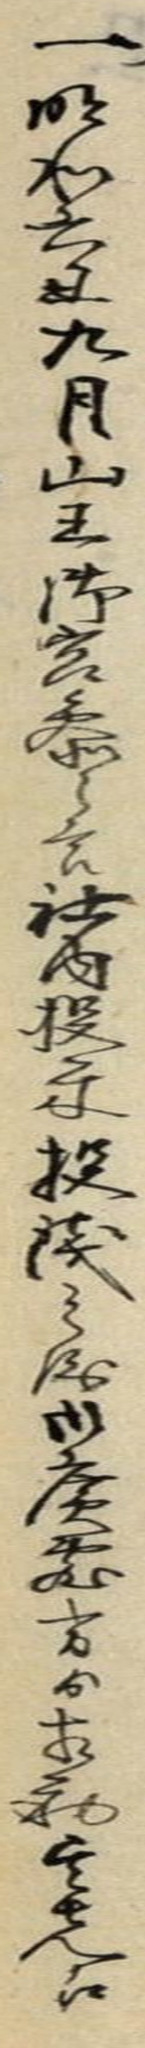一明和六丑九月山王御宮参之節社内投米投銭之儀御広敷方ゟ相勤其先江
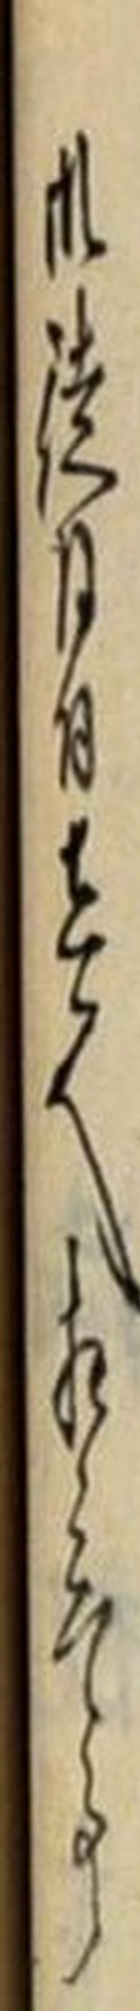御徒目付壱人相参候事
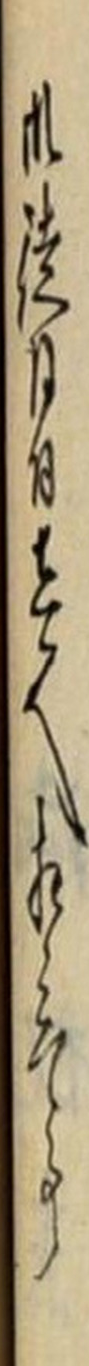御徒目付壱人相参候事
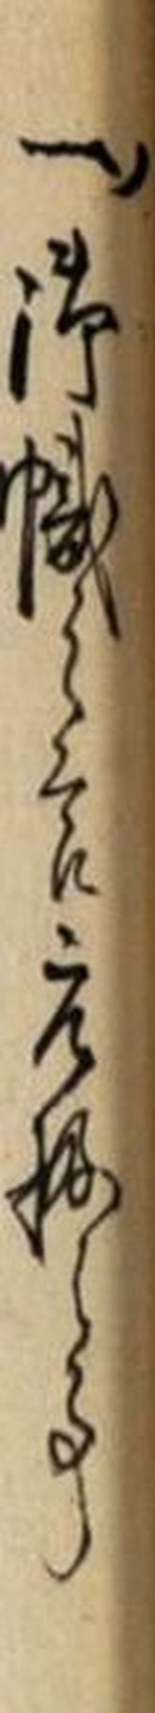一御幟之節取扱之事
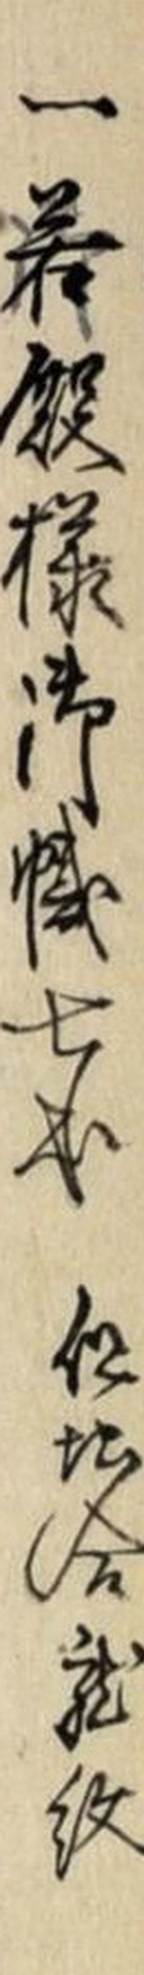一若殿様御幟七本但地合龍紋
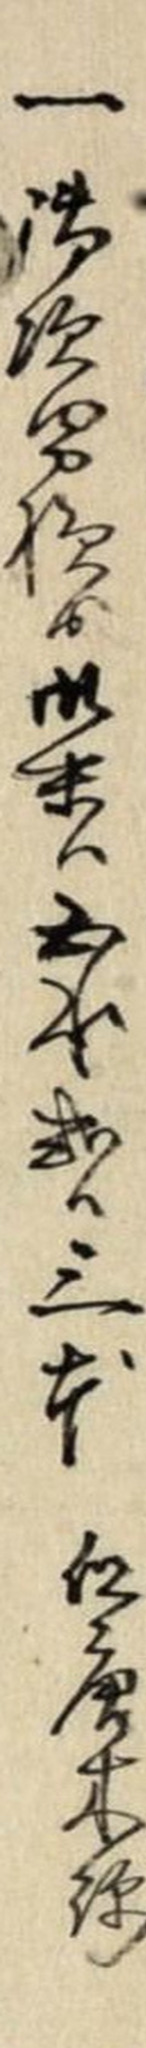一御次男様ゟ御末は五本或は三本但唐木綿
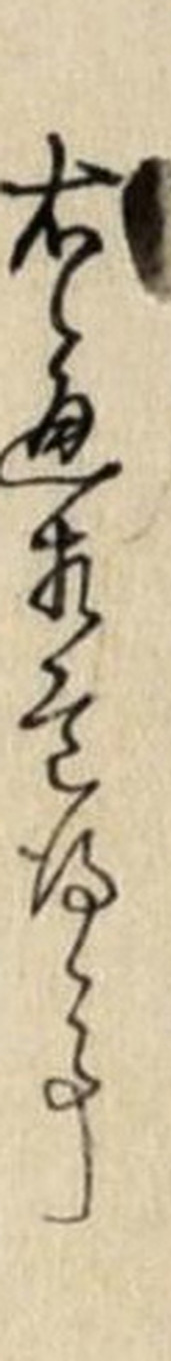右之通相意得候事
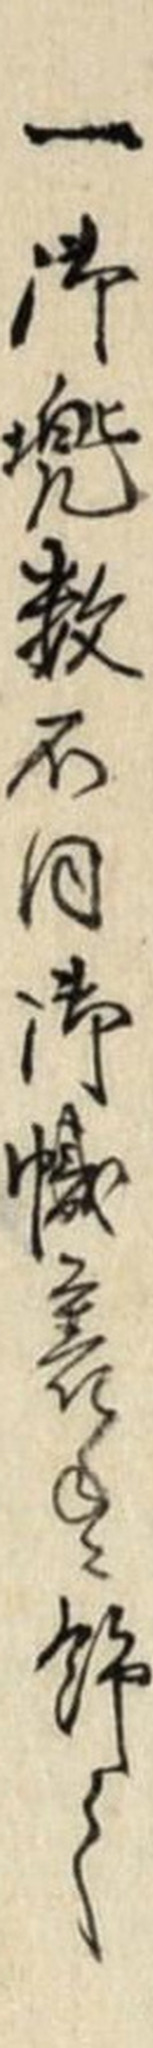一御兜数不同御幟裏手に飾之
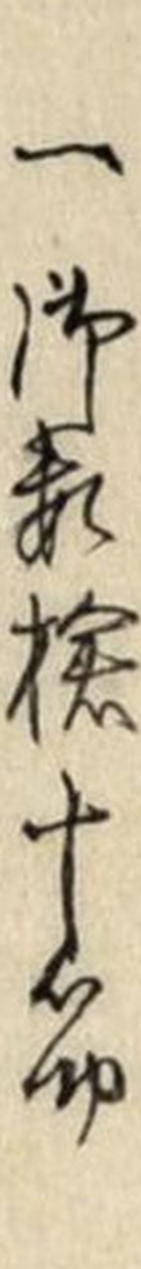一御数槍十筋
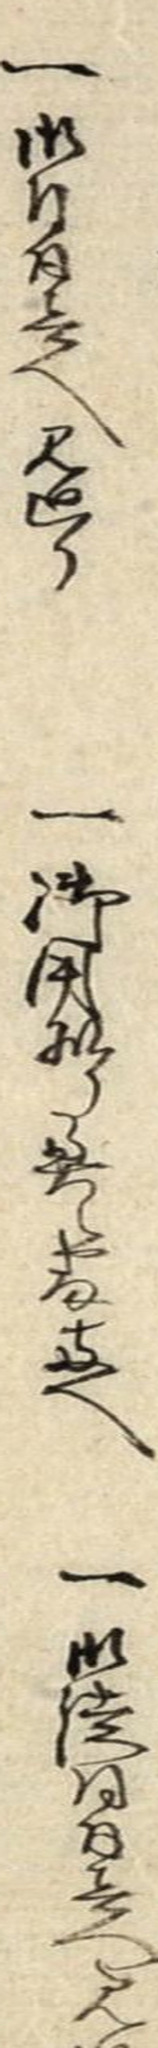一御目付壱人見廻り一御用掛り奥之番両人一御徒目付壱人見廻り
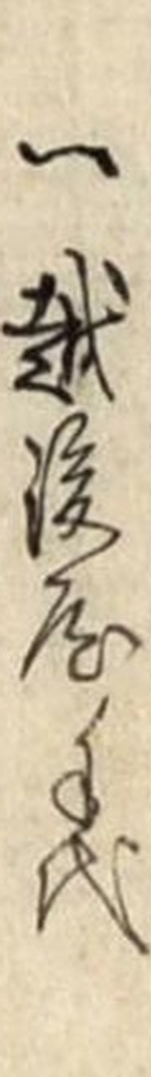一越後屋手代
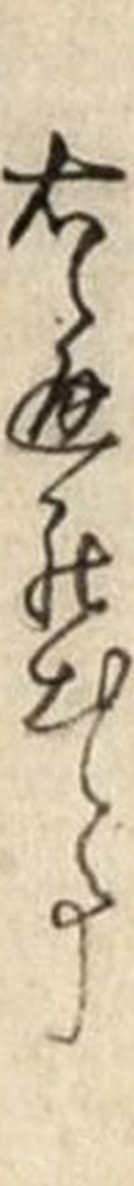右之通罷出候事
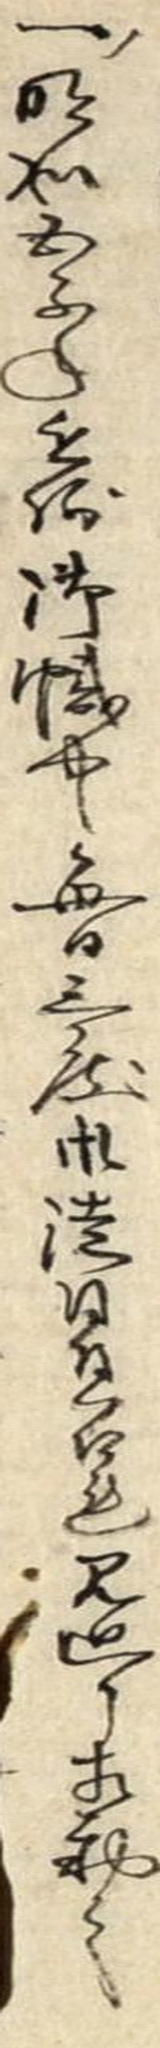一明和五子年近例御幟中毎日三度御徒目付召連見廻り相勤之
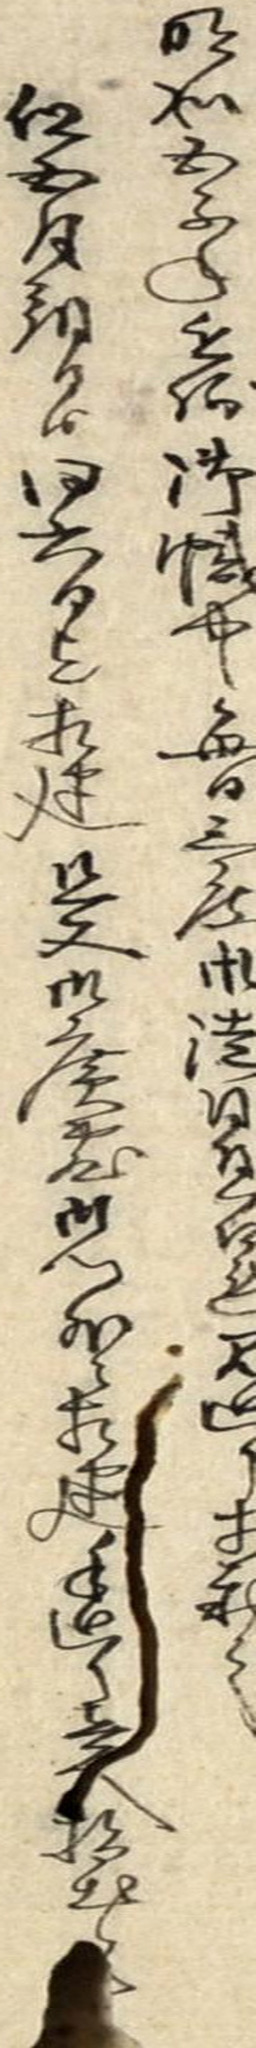但五月朔日ゟ同六日迄相建且又御広敷御門外に相建手廻り壱人指出候
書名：三都并道中之部
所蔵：福井県文書館 Fukui Prefectural Archives
